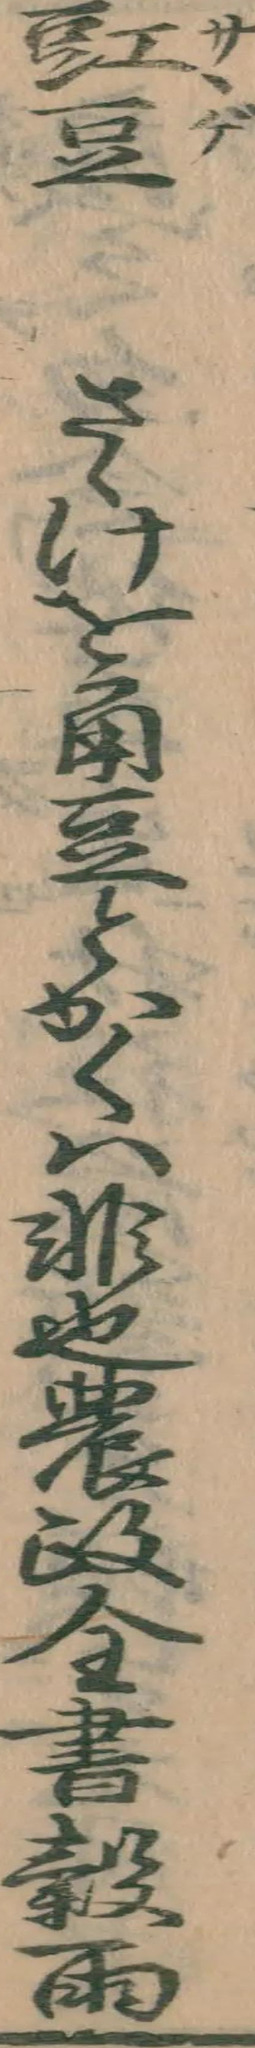豇豆さゝけを角豆とかくハ非也のう農政全書穀雨
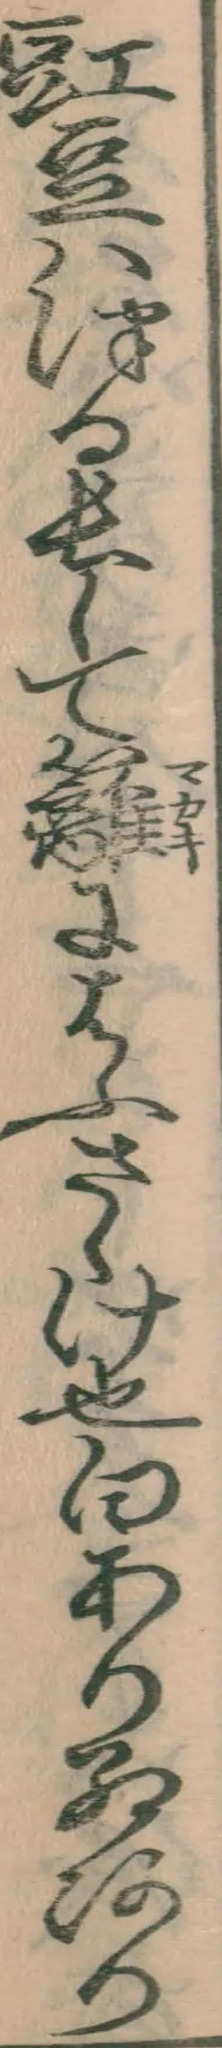豇豆はつる長して籬にはうさゝけ也白あり色あり
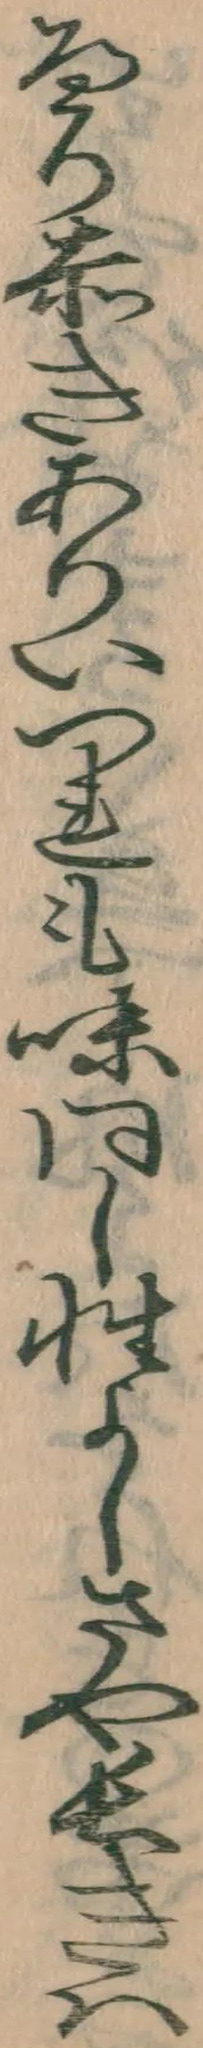赤きありいつれも味同し性よしさや長きハ
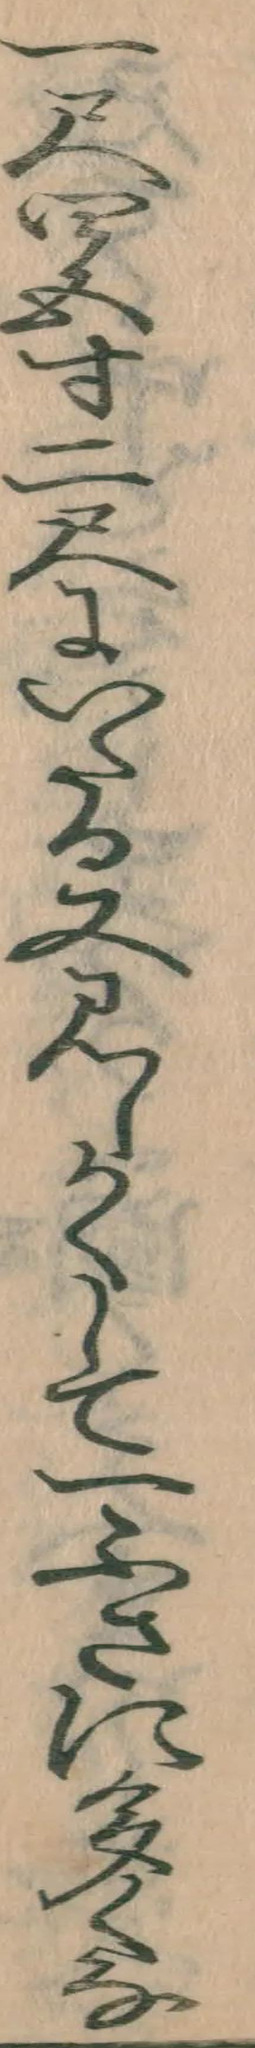一尺四五寸二尺にいたる又みしかくして一ふさに多くな
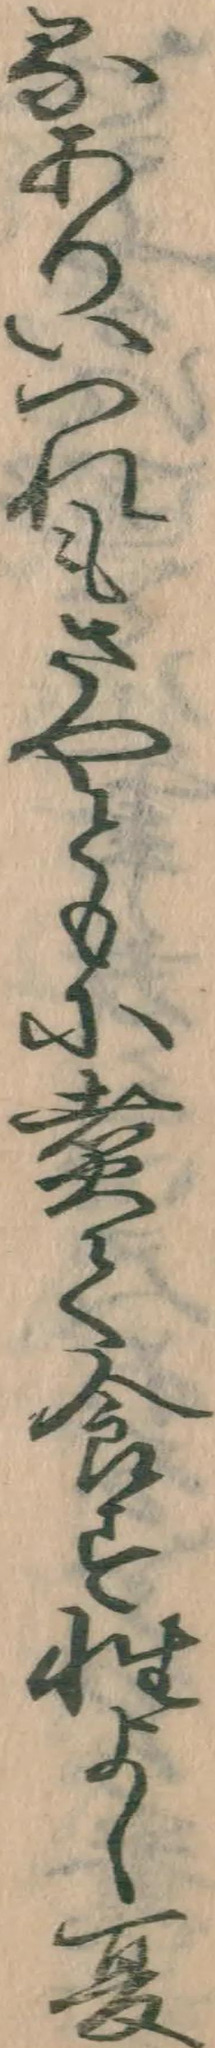ありいつれもさやともに煮て食す性よし夏
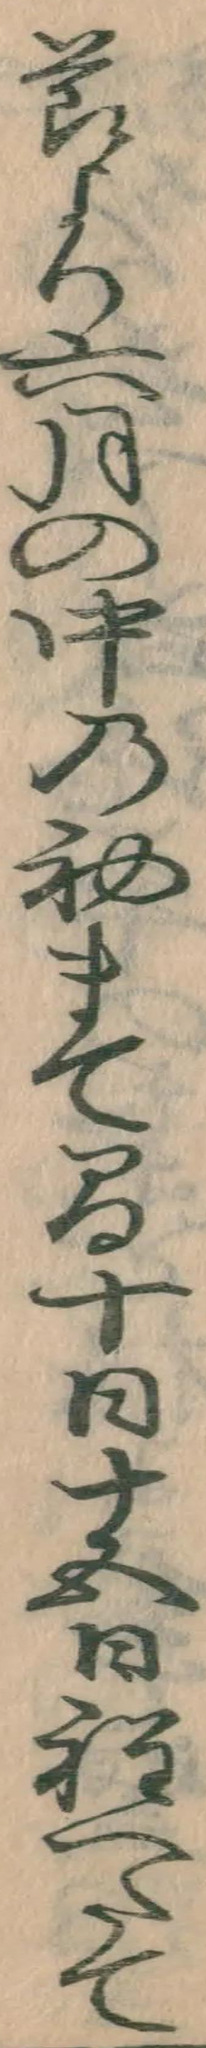前より六月の中ノ物まて十日十五日程へたて
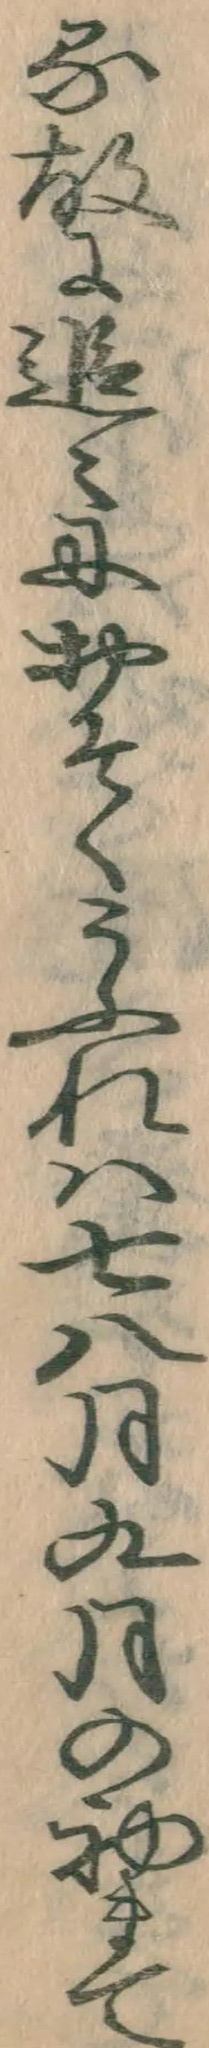ゆに追々におそくうふれハ七八月九月の物まて
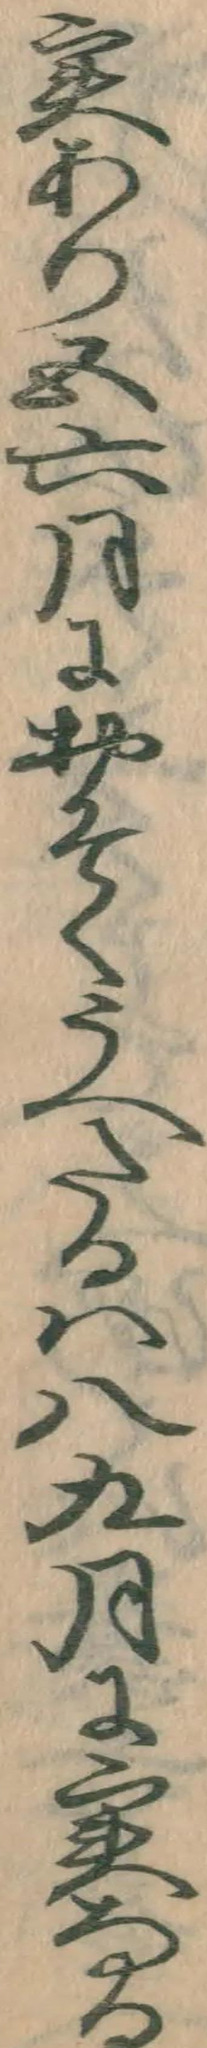実あり又六月におそくうへたるハ八九月に実なる

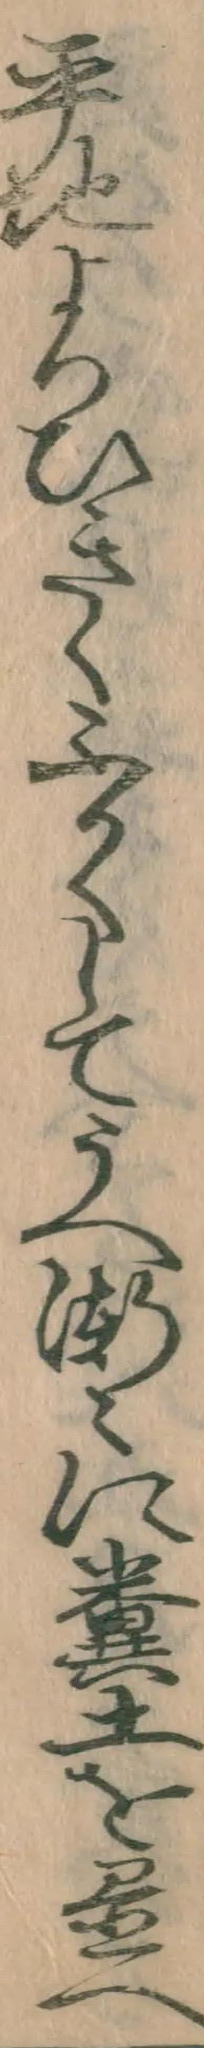平地よりひきくふかくしてうへ漸々に糞土をへ
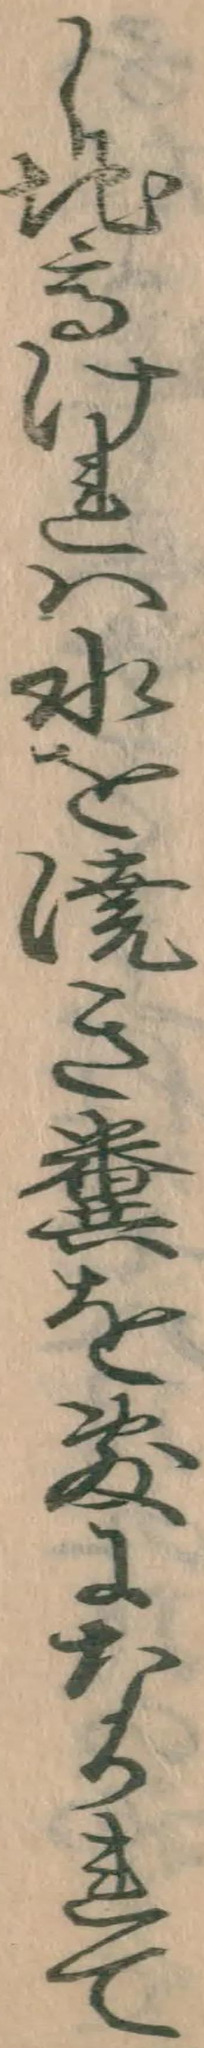しけれハ水をきくそを敷になかれて
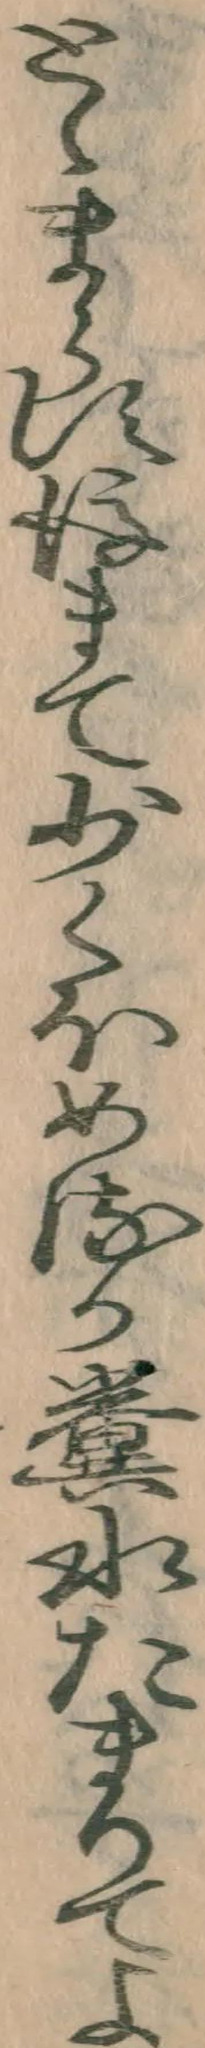としまらす後まて少くほめ糞水たまりてよ
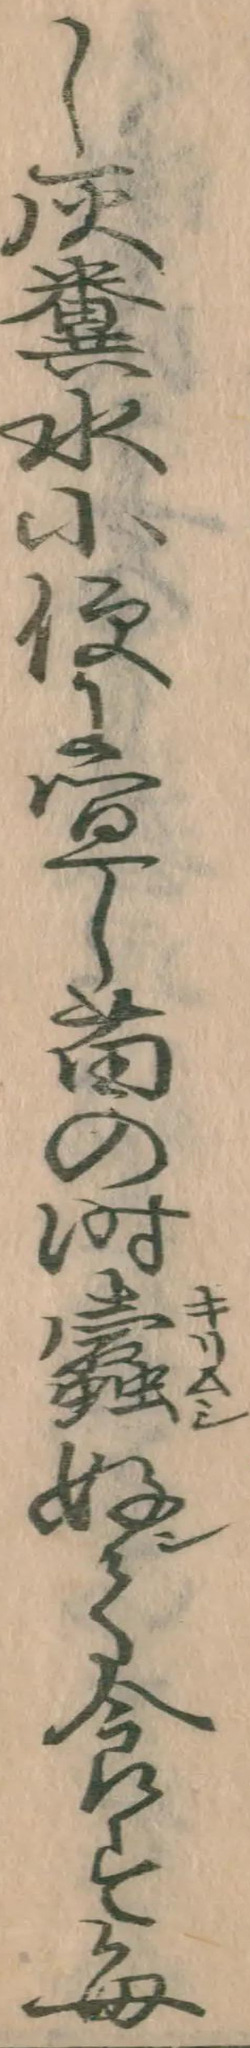し灰糞水小便宜し苗の時蠧好むて含す
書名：菜譜 3巻
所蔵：国立国会図書館 National Diet Library, JAPAN
